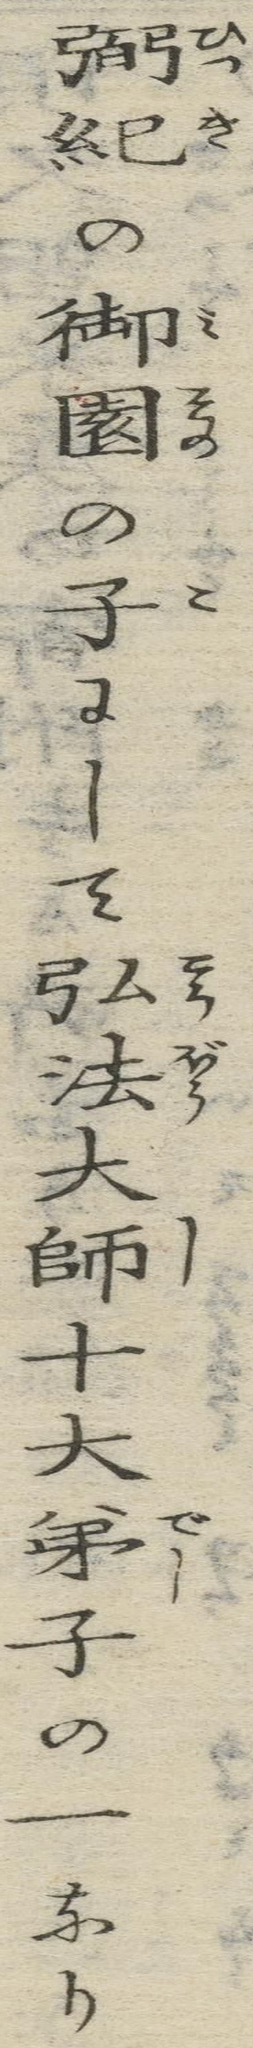弼紀の御園の子にして弘法大師十大弟子の一なり
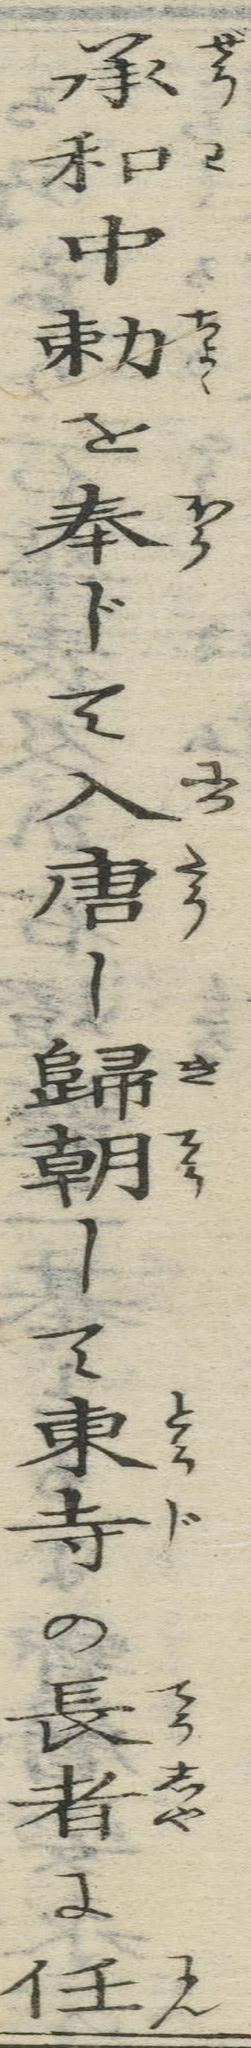承和中勅を奉じて入唐し帰朝して東寺の長者に任
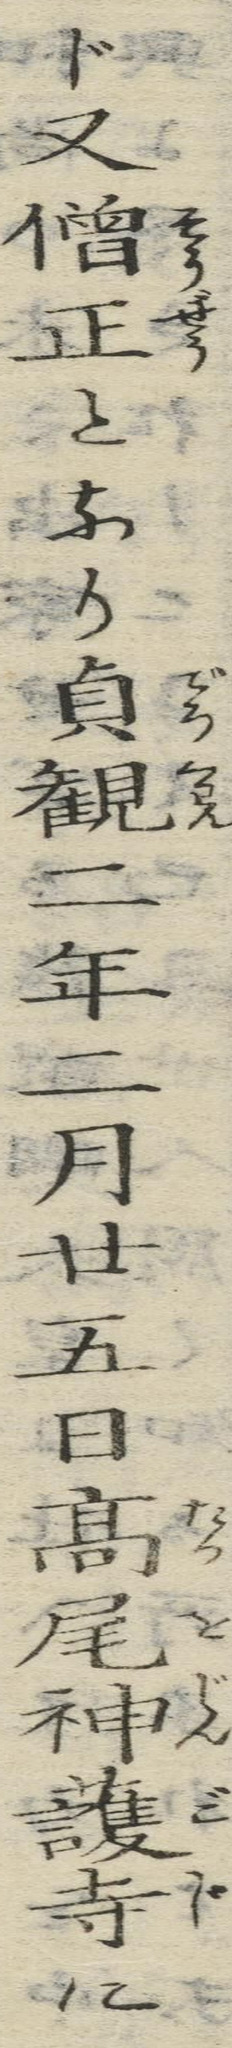じ又僧正となり貞観二年二月廿五日高尾神護寺に
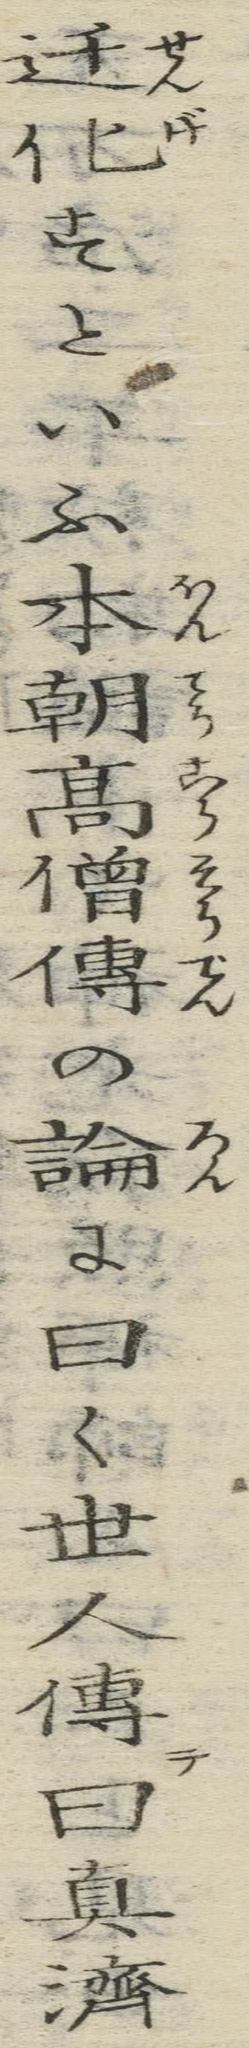遷化すといふ本朝高僧伝の論に曰く世人伝曰真済
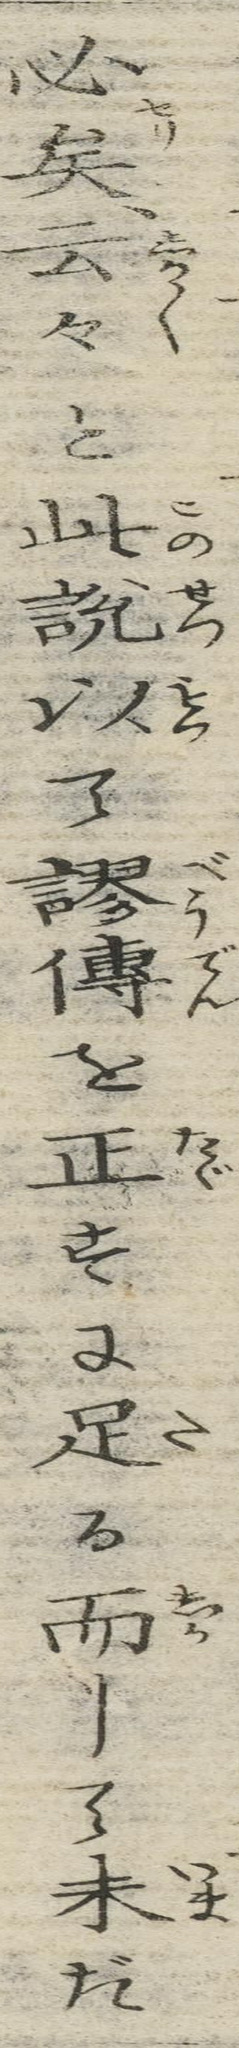必矣、云々と此説以て謬伝を正すに足る而して未だ
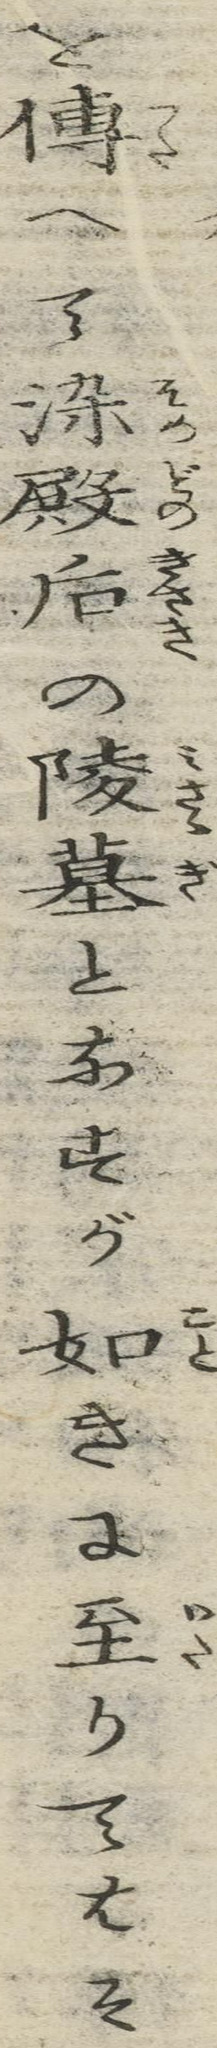を伝へて染殿后の陵墓となすが如きに至りてはそ
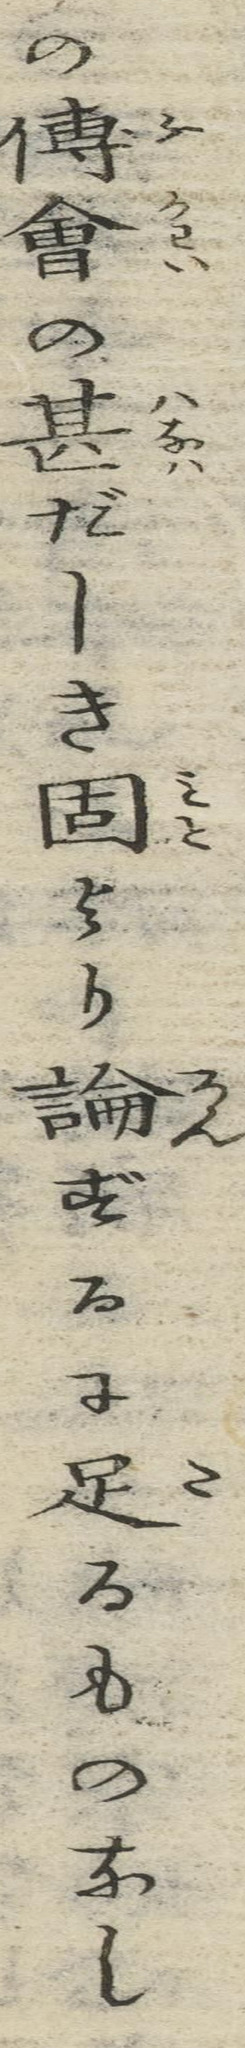の伝会の甚だしき固より論ずるに足るものなし

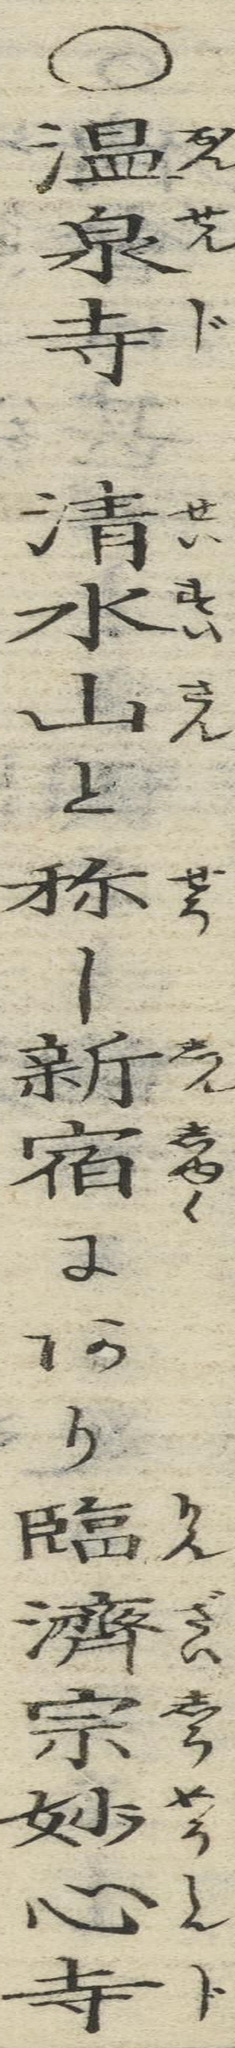○温泉寺清水山と称し新宿にあり臨済宗妙心寺
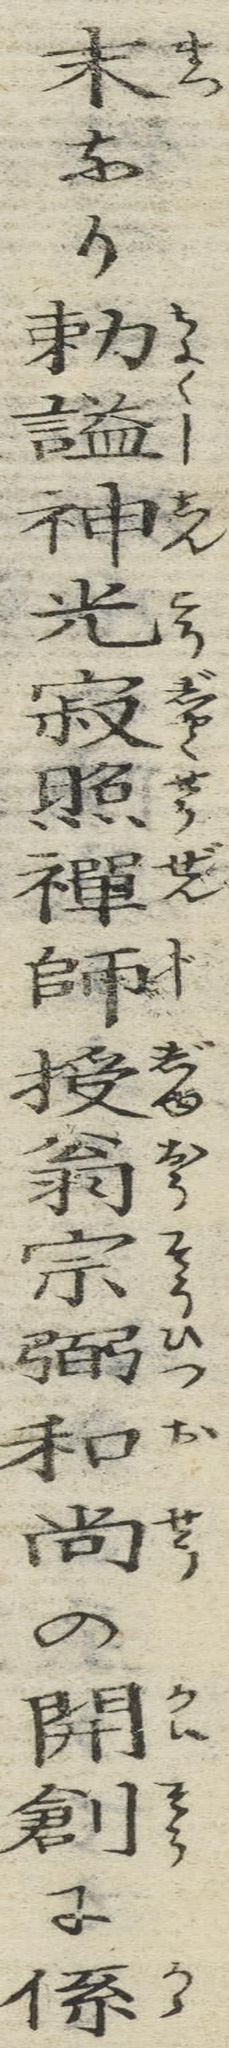末なり勅謚神光寂照禅師授翁宗弼和尚の開創に係
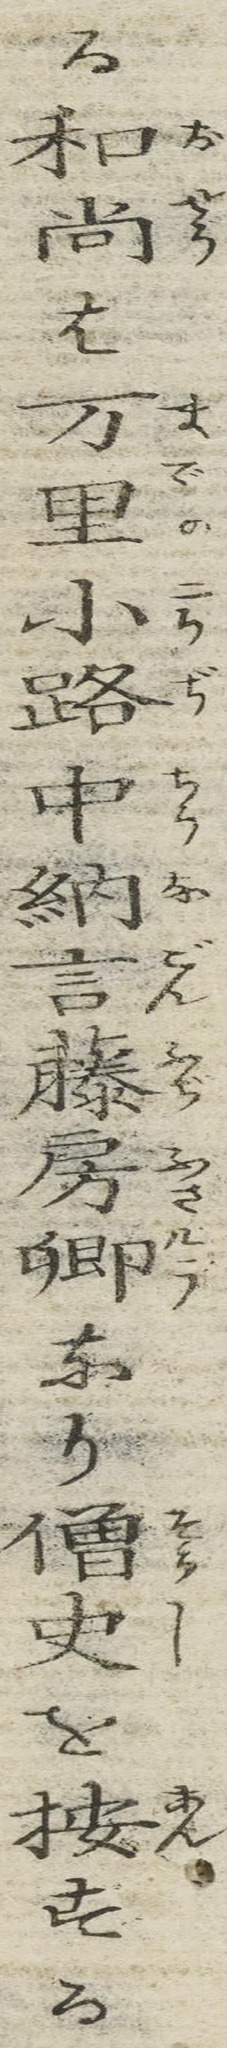る和尚は万里小路中納言藤房卿なり僧史を按する
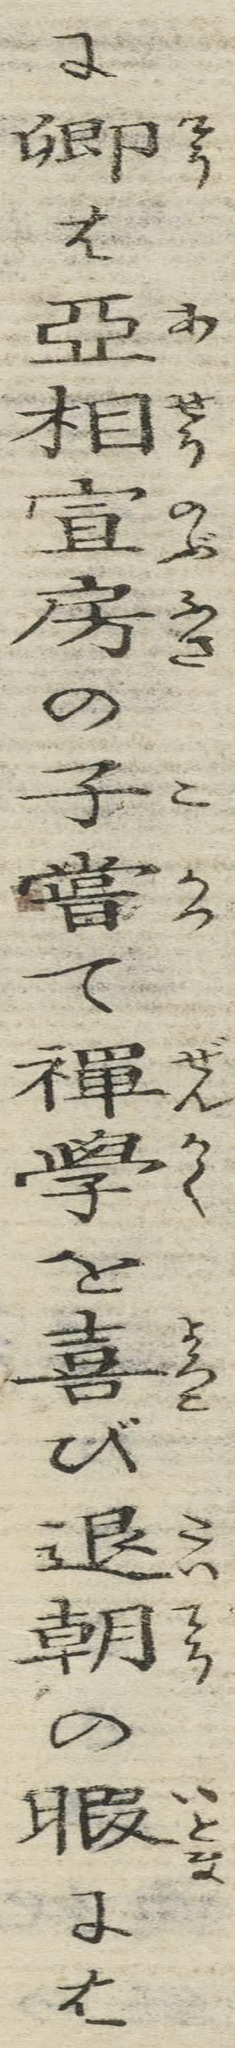に卿は亜相宣房の子嘗て禅学を喜び退朝の暇には
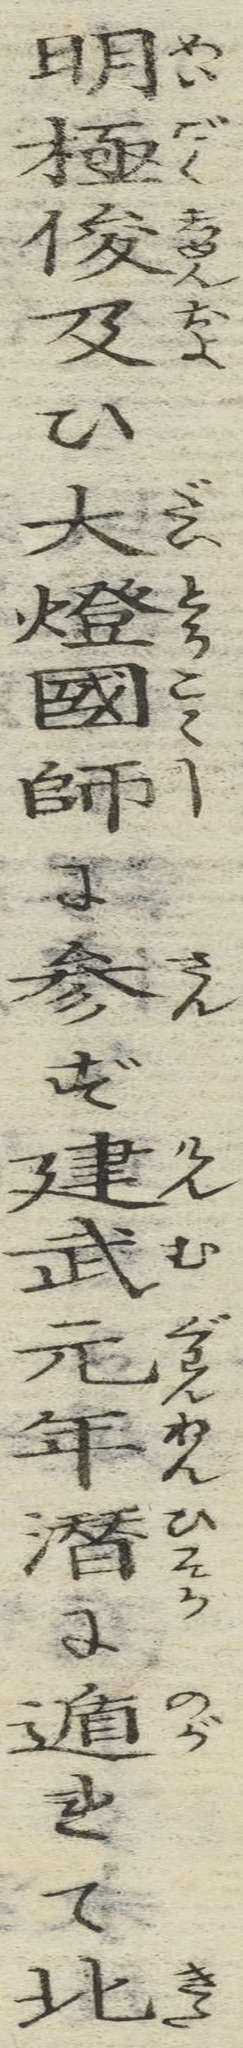明極俊及び大燈国師に参ず建武元年潜に遁れて北
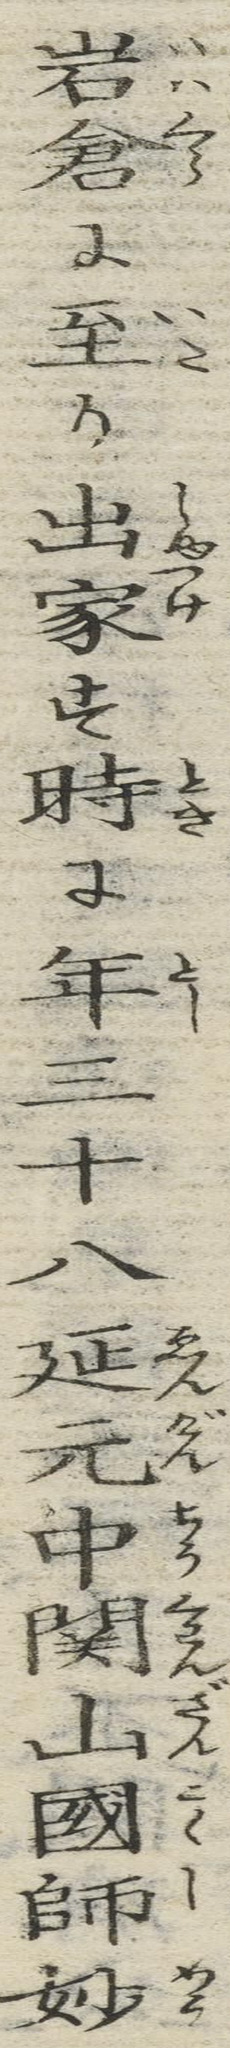岩倉に至り出家す時に年三十八延元中関山国師妙
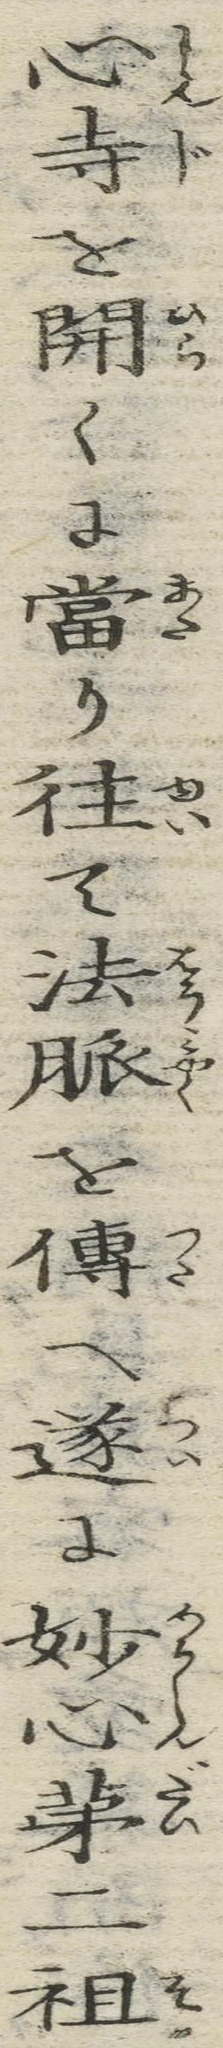心寺を開くに当り往て法脈を伝へ遂に妙心第二祖
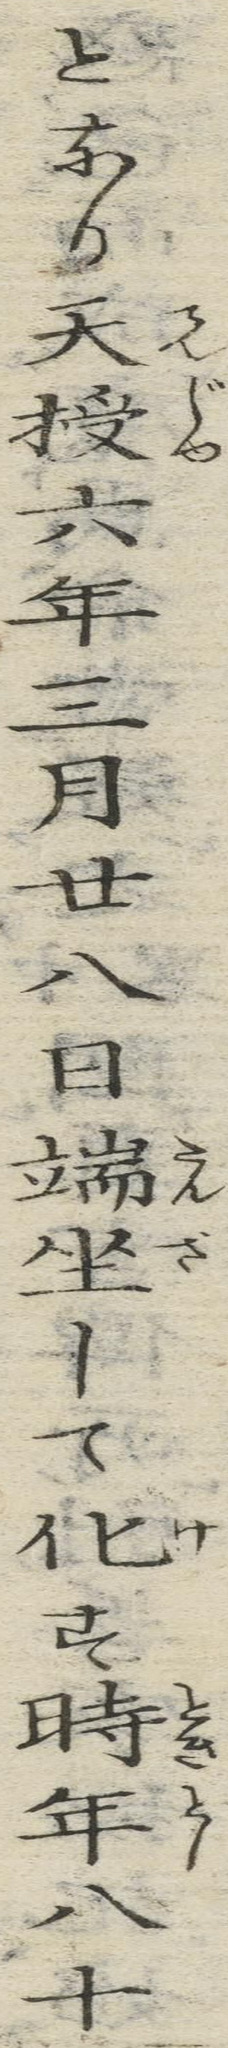となり天授六年三月廿八日端坐して化す時年八十
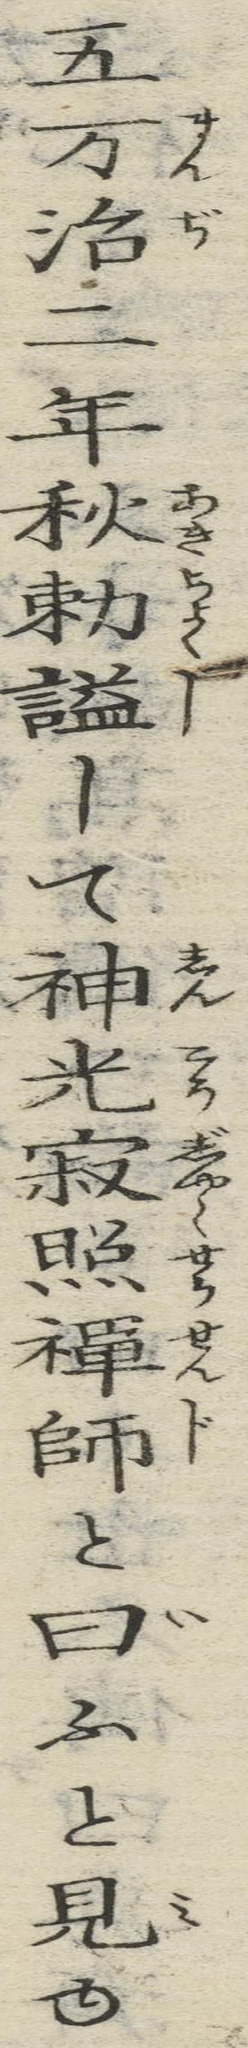五万治二年秋勅謚して神光寂照禅師と曰ふと見ゆ
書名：豆州熱海誌　完
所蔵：東京大学地震研究所図書室 Earthquake Research Institute Library, The University of Tokyo, JAPAN
